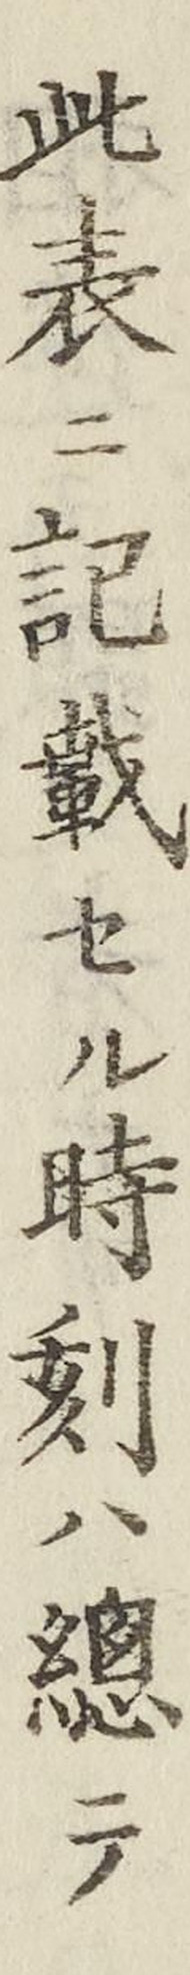此表ニ記載セル時刻ハ総テ
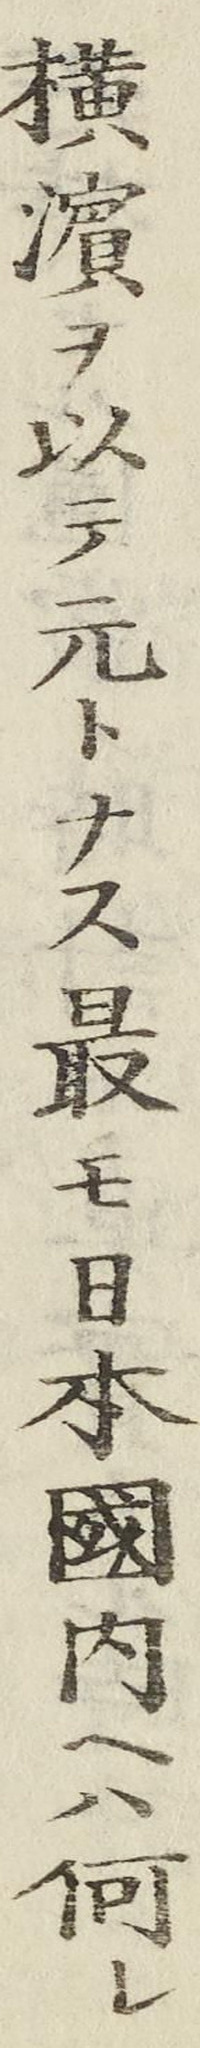横浜ヲ以テ元トナス最モ日本国内ヘハ何レ
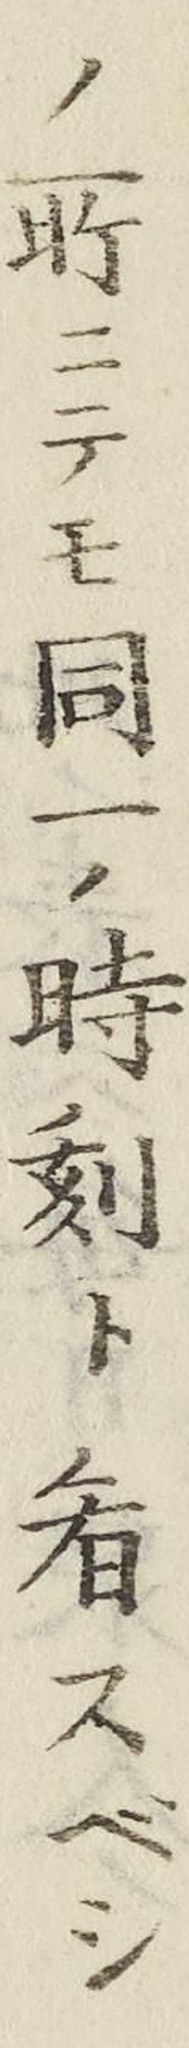ノ所ニテモ同一ノ時刻ト看スベシ
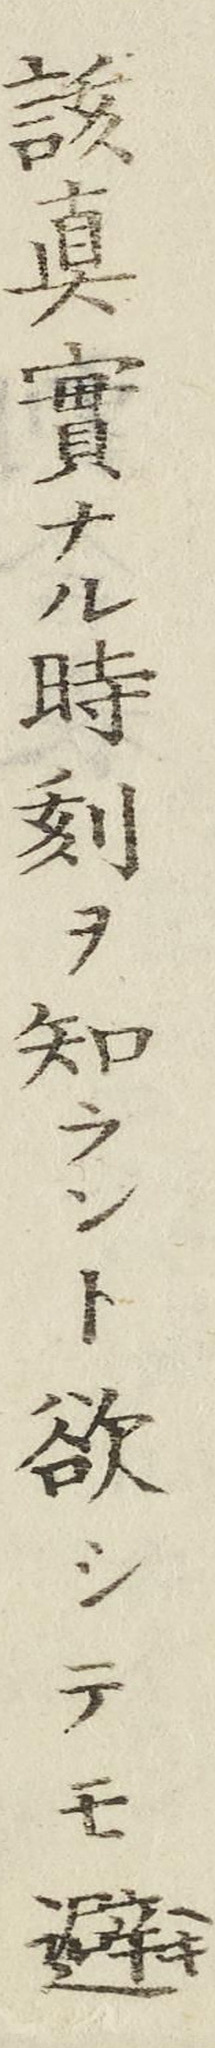該真実ナル時刻ヲ知ラント欲シテモ避
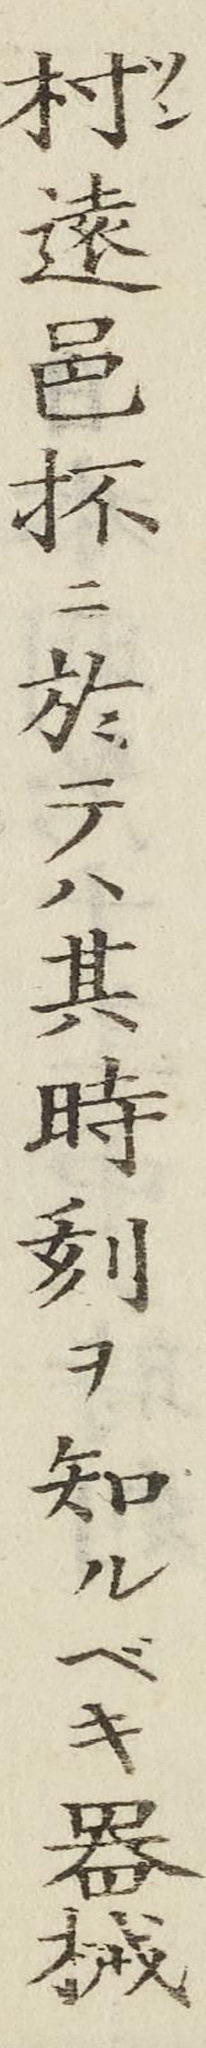村遠邑抔ニ於テハ其時刻ヲ知ルベキ器械
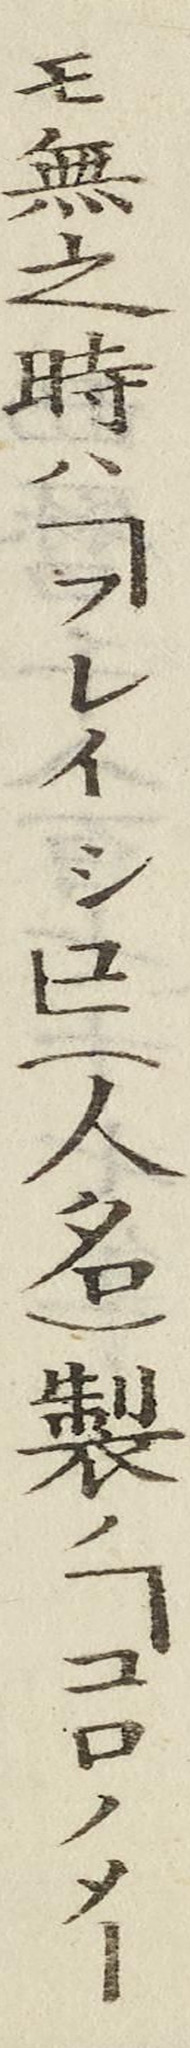モ無之時ハ「フレイシユ」製ノ「コロノメー
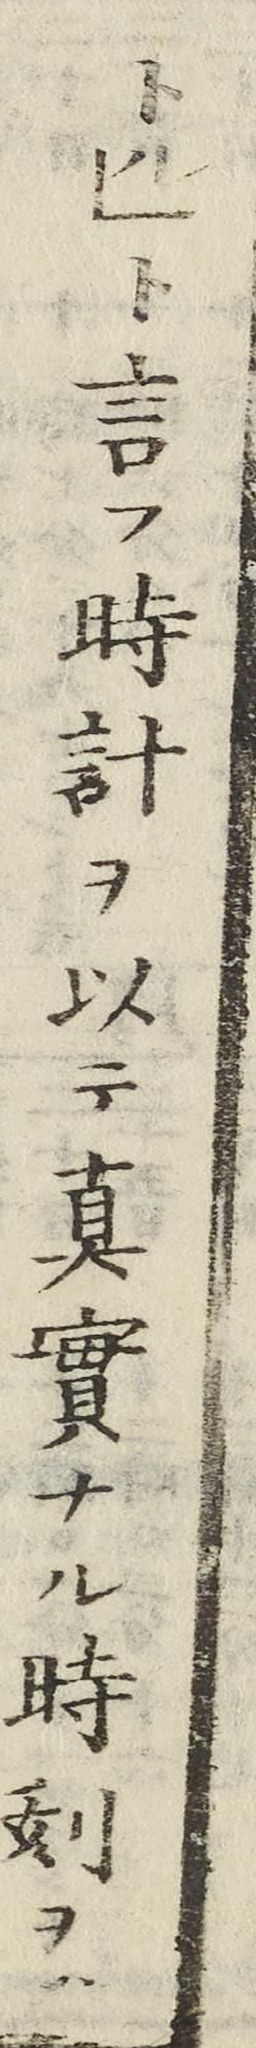トル」ト言フ時計ヲ以テ真実ナル時刻ヲ
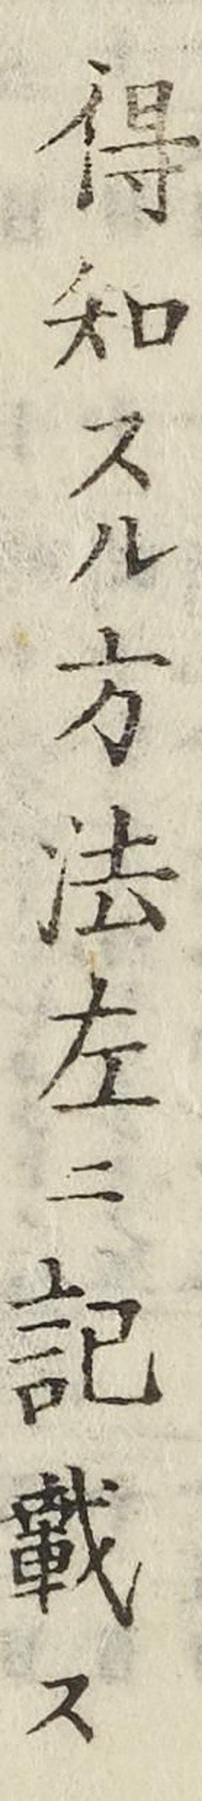得知スル方法左ニ記載ス
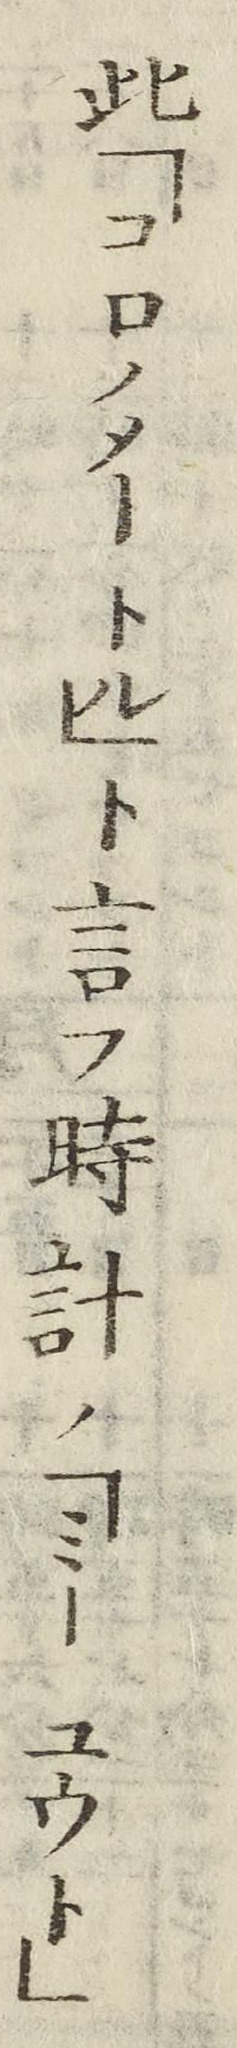此「コロノメートル」ト言フ時計ノ「ミーユウト」
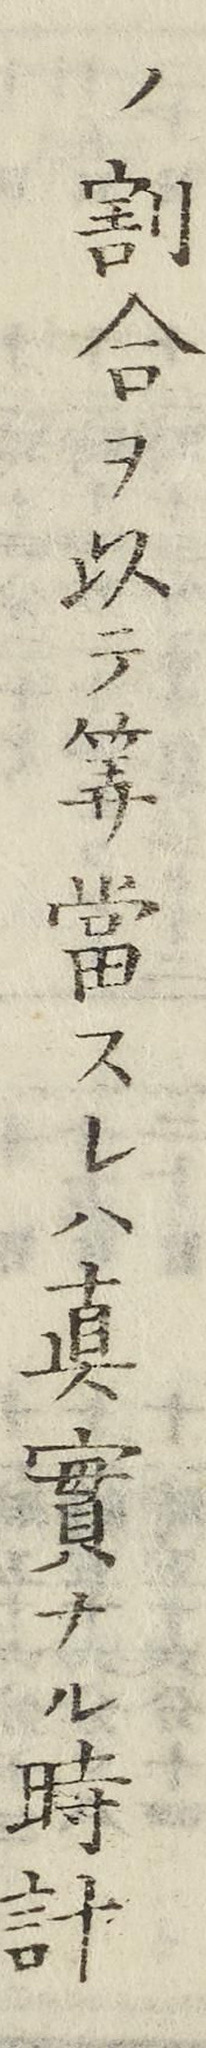ノ割合ヲ以テ算当スレハ真実ナル時計
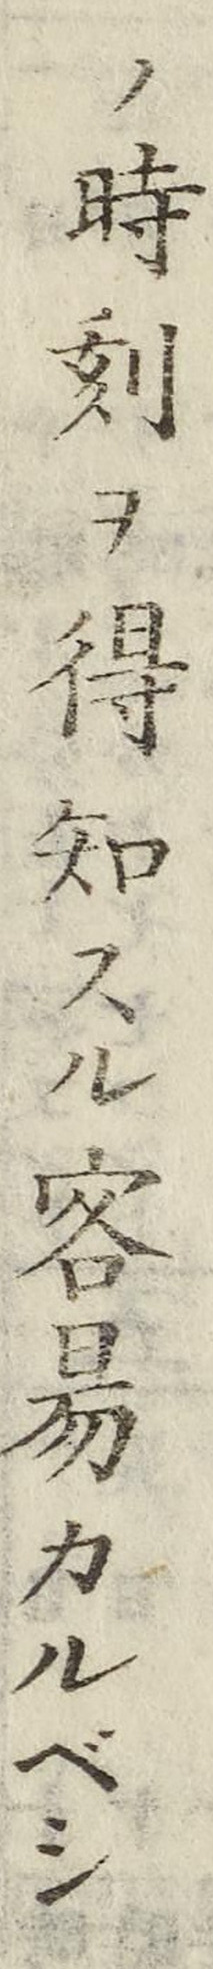ノ時刻ヲ得知スル容易カルベシ
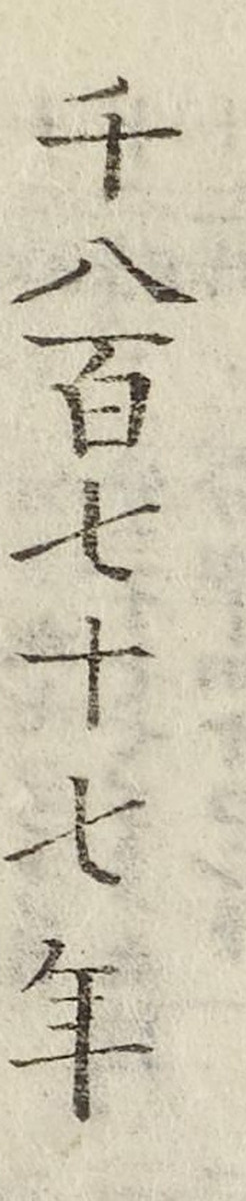千八百七十七年
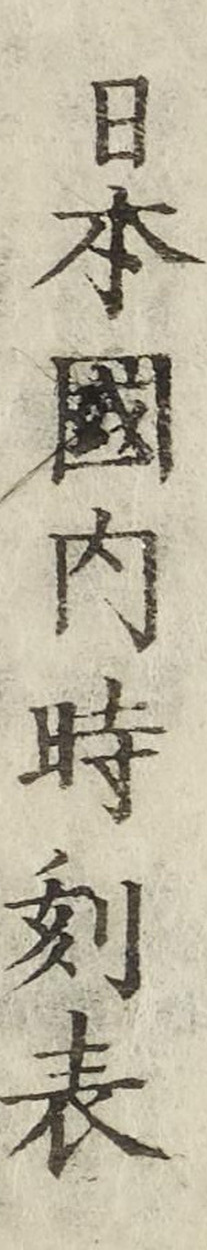日本国内時刻表

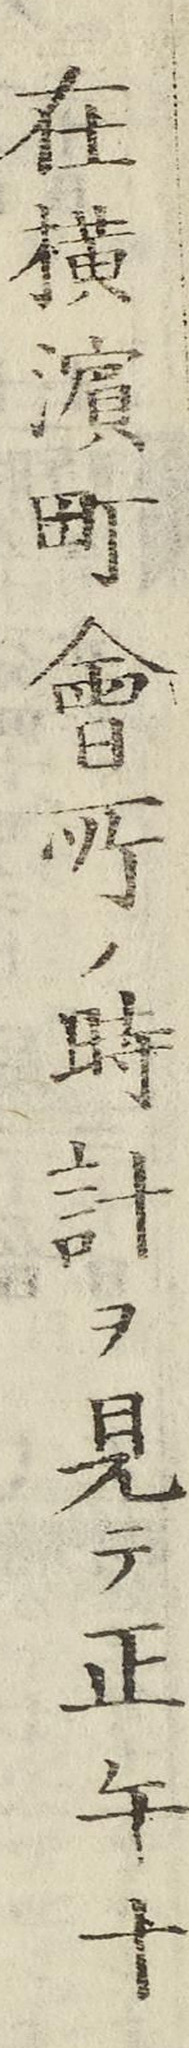在横浜町会所ノ時計ヲ見テ正午十
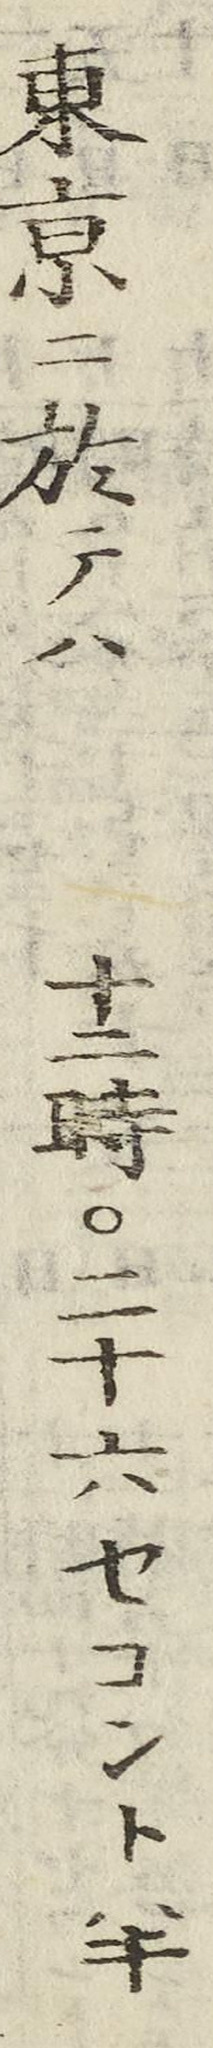東京ニ於テハ十二時〇二十六セコント半
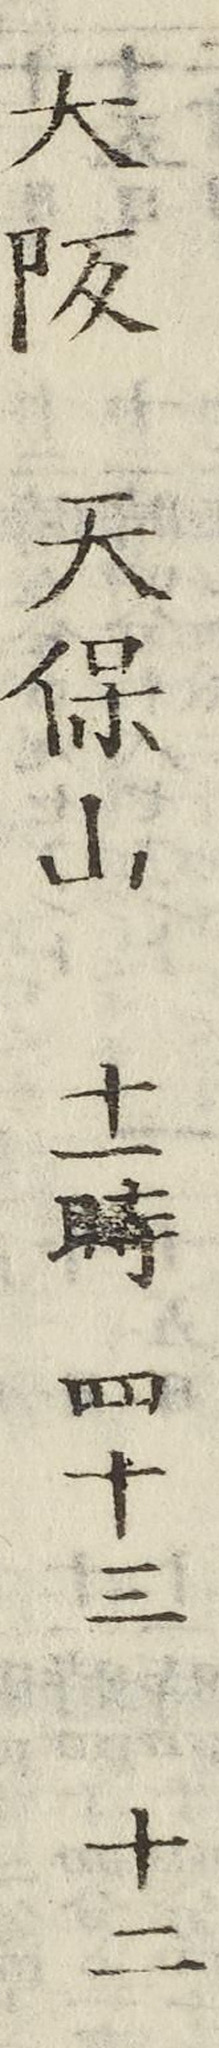大阪天保山十一時四十三十二
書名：[時計に関する冊子]
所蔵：東京大学地震研究所図書室 Earthquake Research Institute Library, The University of Tokyo, JAPAN
